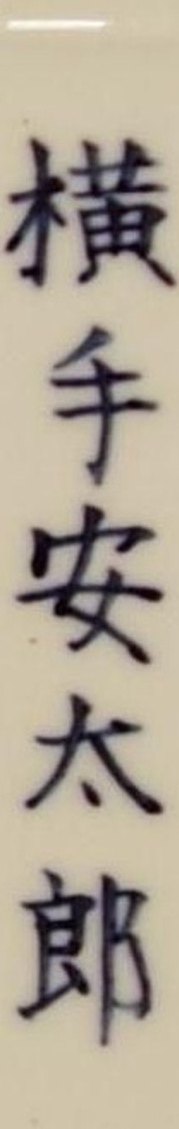横手安太郎
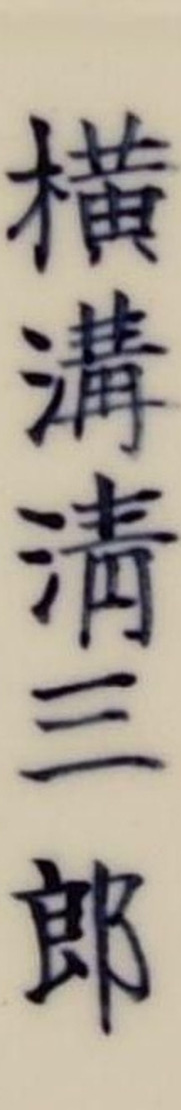横溝清三郎
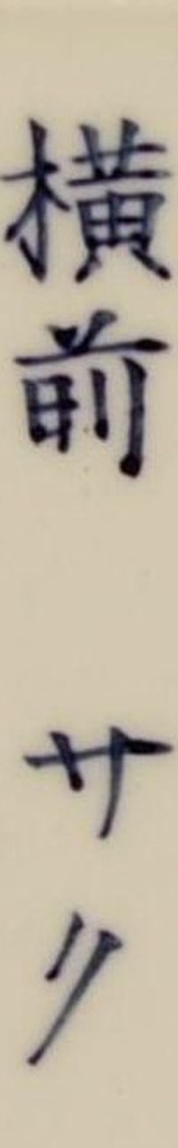横前サク
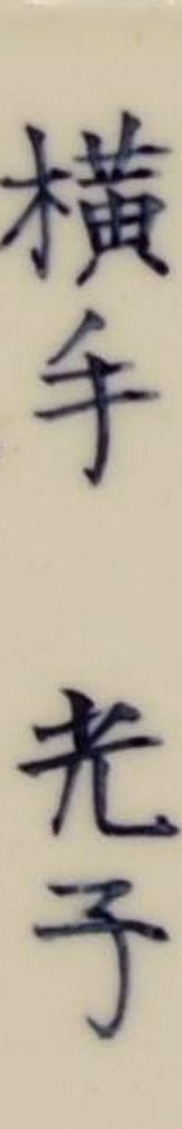横手光子
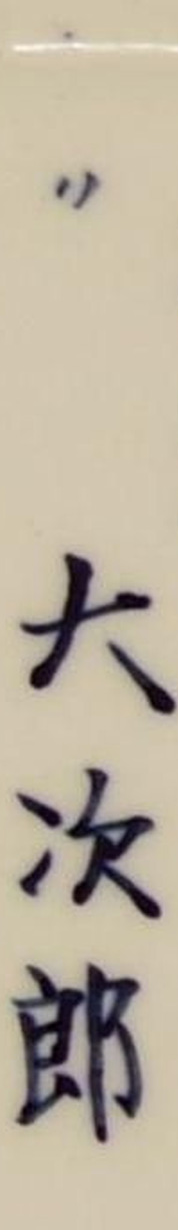大次郎
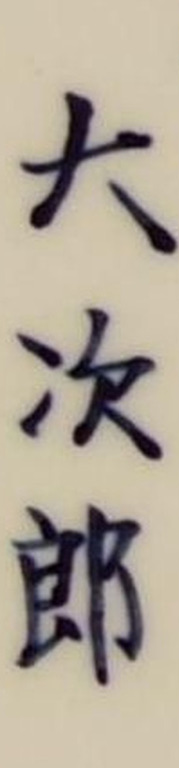大次郎
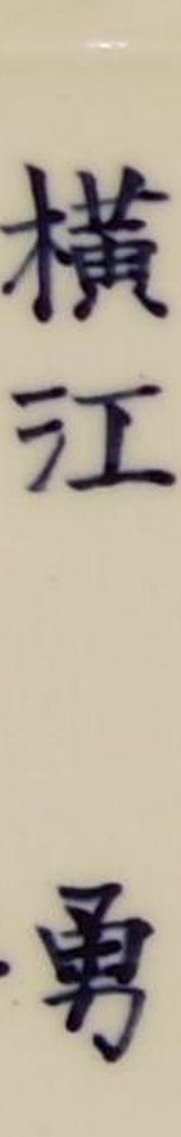横江勇
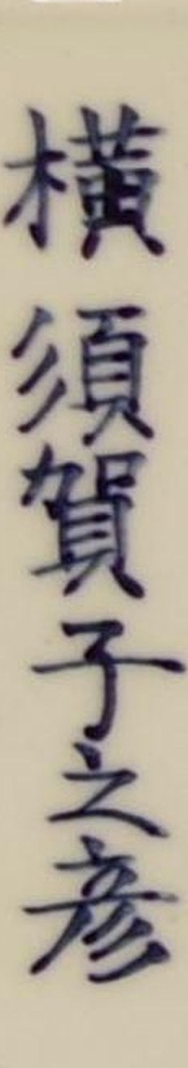横須賀子之彦
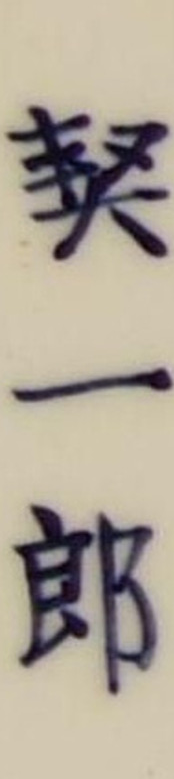契一郎
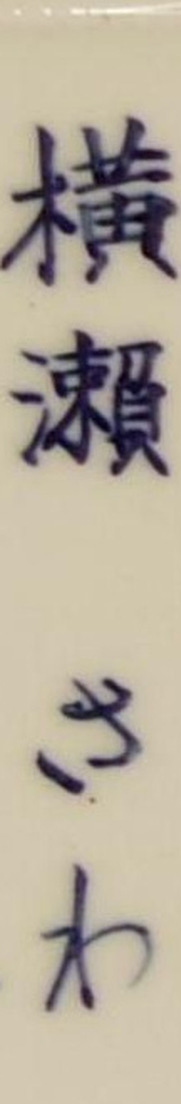横瀬さわ

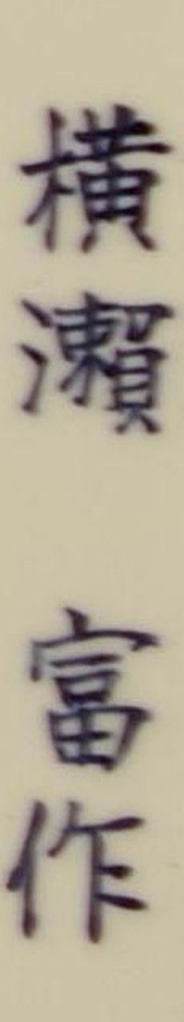横瀬富作
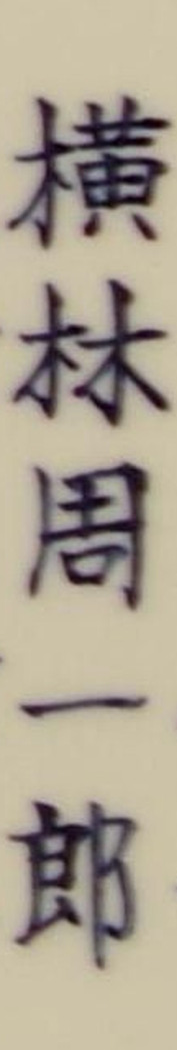横林周一郎
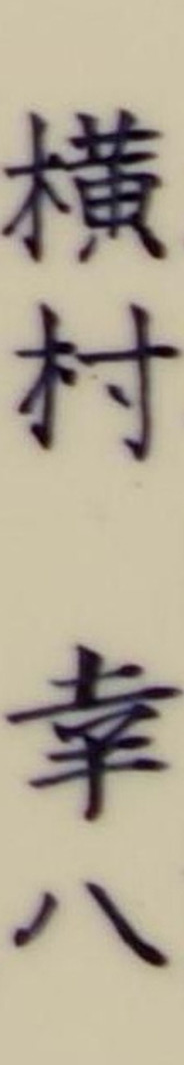横村幸八
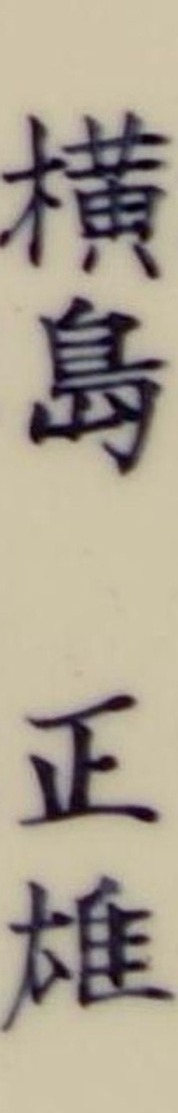横島正雄
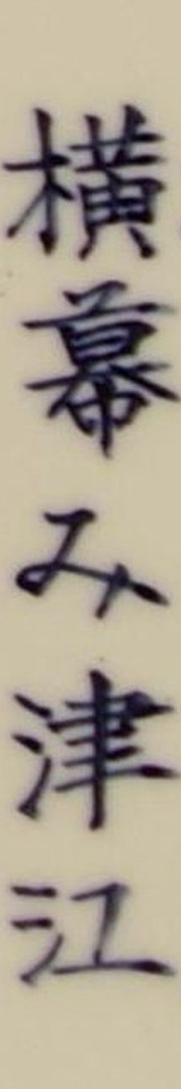横幕み津江
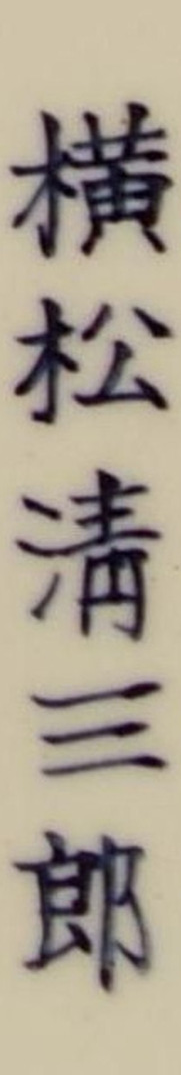横松清三郎
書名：A~D
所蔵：koyasan kongobuji
